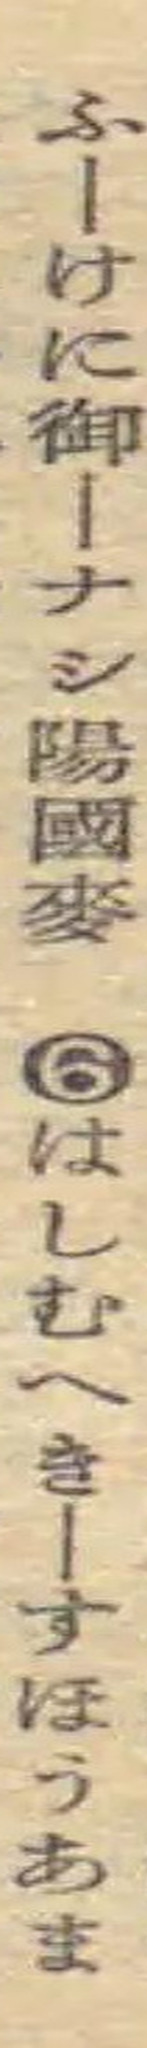ふ―けに御―ナシ陽国麦❻はしむへき―すほうあま
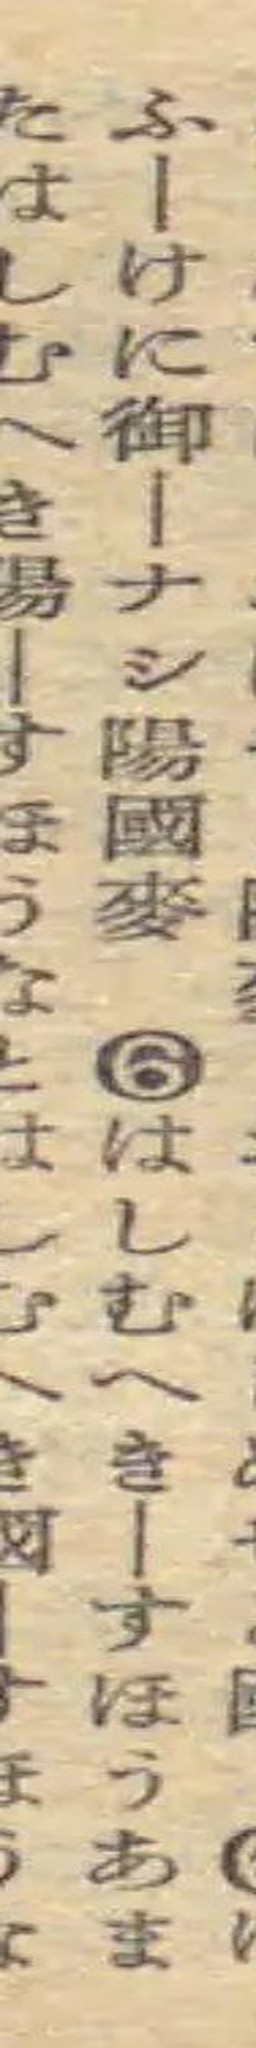たはしむへき陽―すほうなとはしむへき国―すほうな
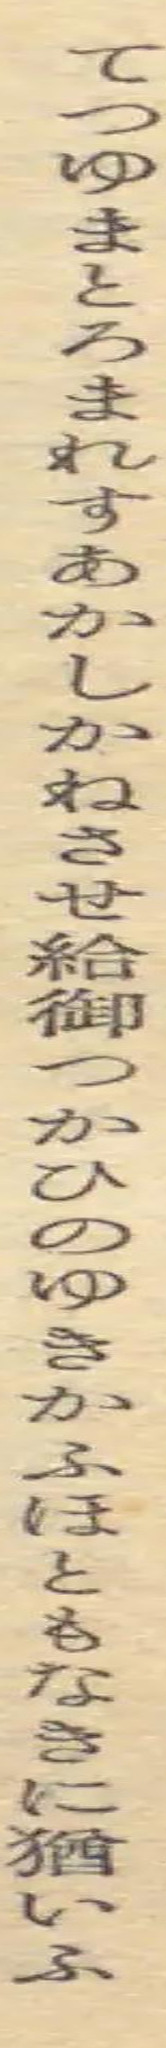てつゆまとろまれすあかしかねさせ給御つかひのゆきかふほともなきに猶いふ
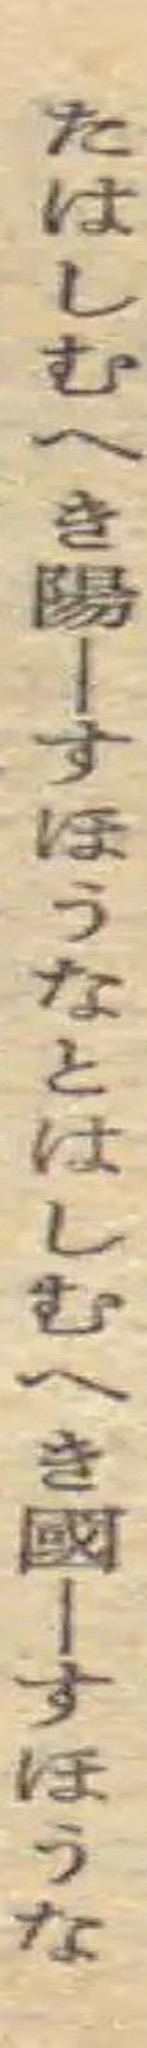たはしむへき陽―すほうなとはしむへき国―すほうな
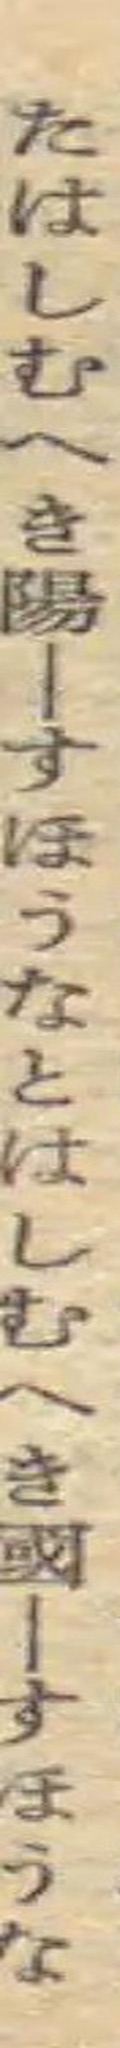たはしむへき陽―すほうなとはしむへき国―すほうな
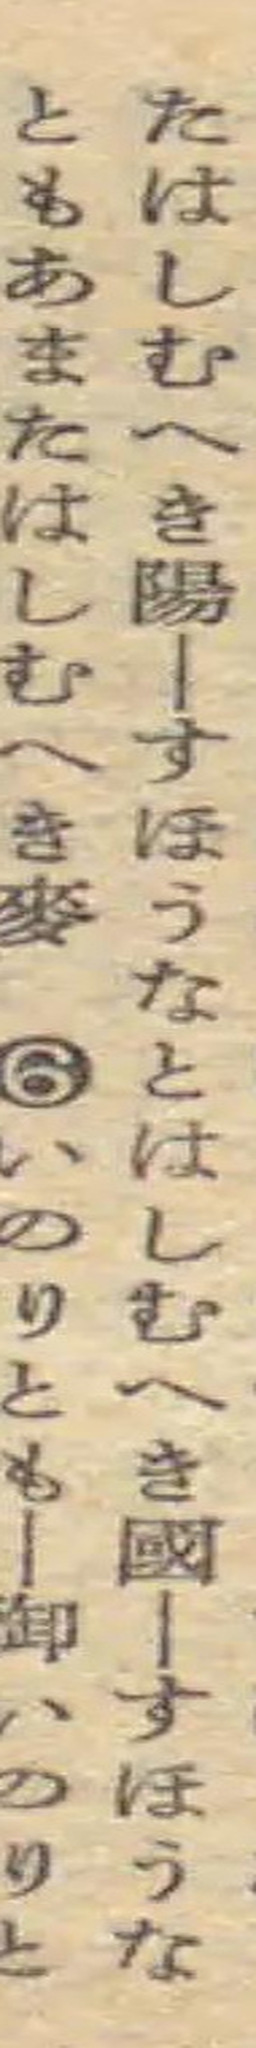ともあまたはしむへき麦❻いのりとも―御いのりと
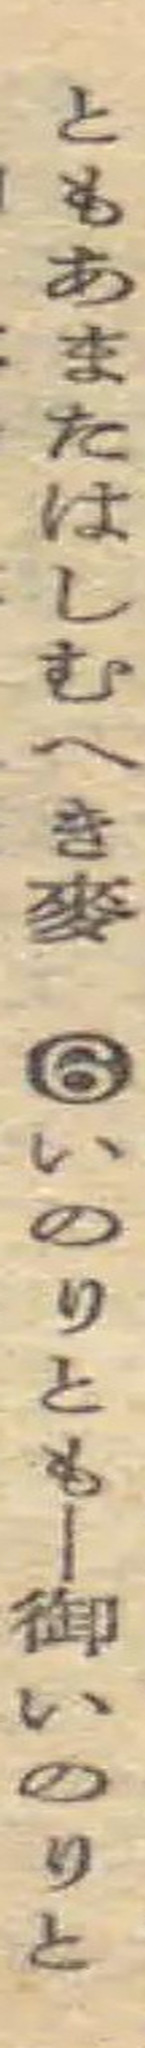ともあまたはしむへき麦❻いのりとも―御いのりと
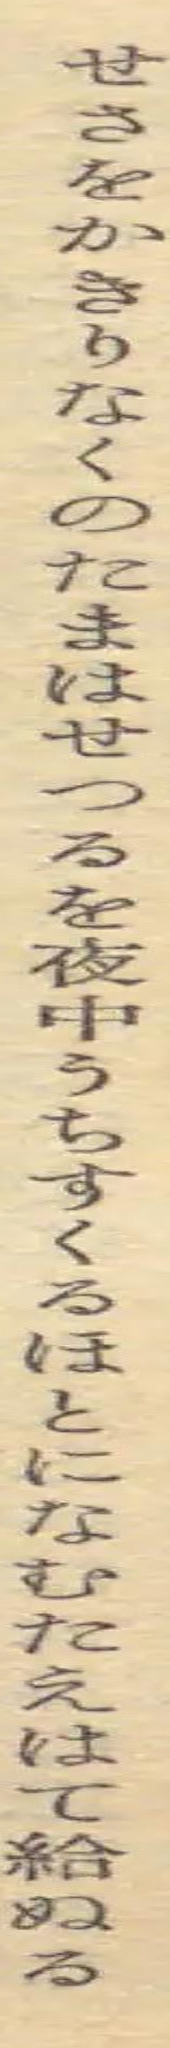せさをかきりなくのたまはせつるを夜中うちすくるほとになむたえはて給ぬる
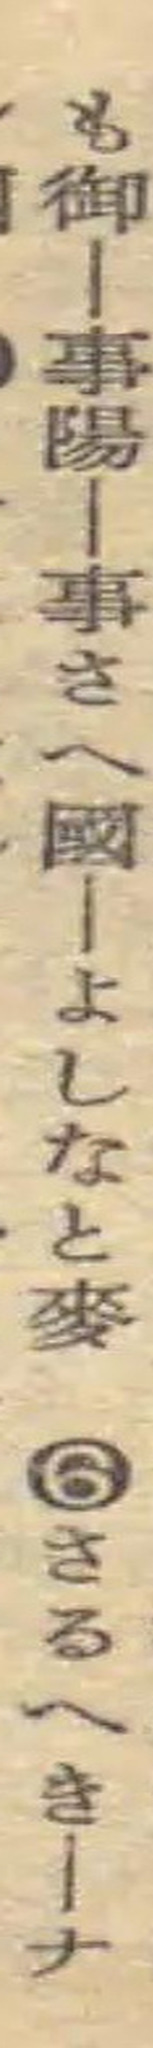も御―事陽―事さへ国―よしなと麦❻さるへき―ナ
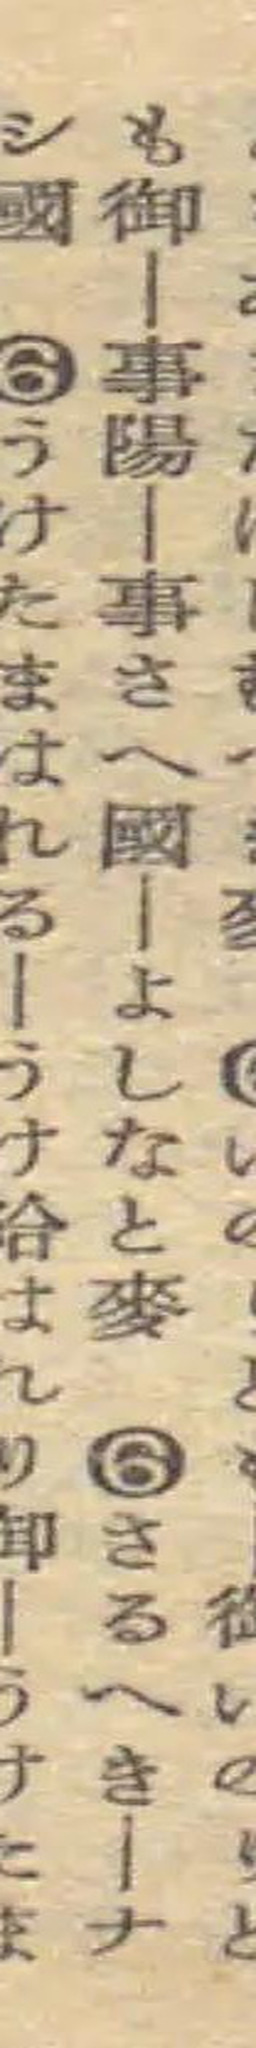シ国❻うけたまはれる―うけ給はれり御―うけたま
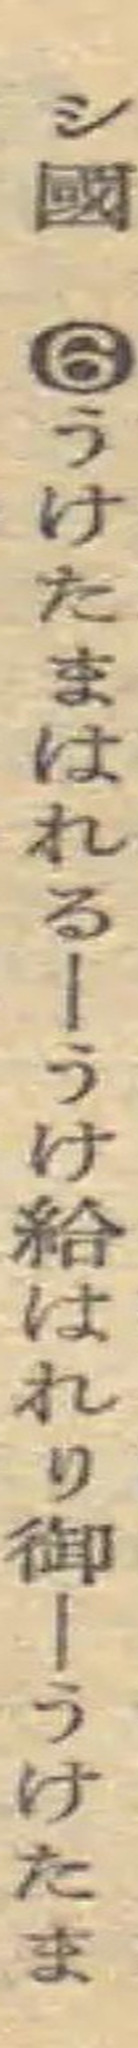シ国❻うけたまはれる―うけ給はれり御―うけたま
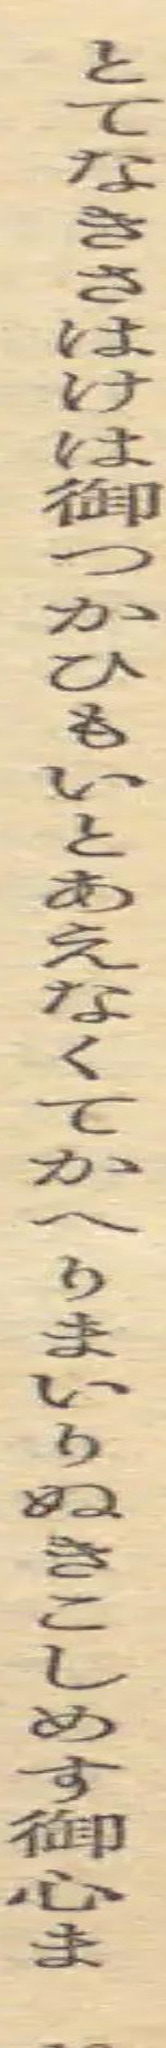とてなきさはけは御つかひもいとあえなくてかへりまいりぬきこしめす御心ま
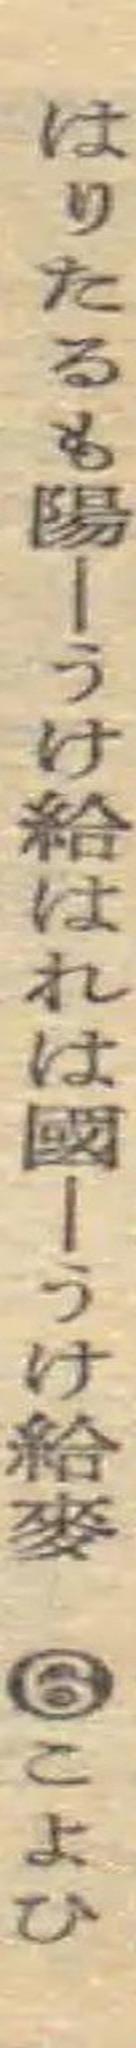はりたるも陽―うけ給はれは国―うけ給麦❻こよひ
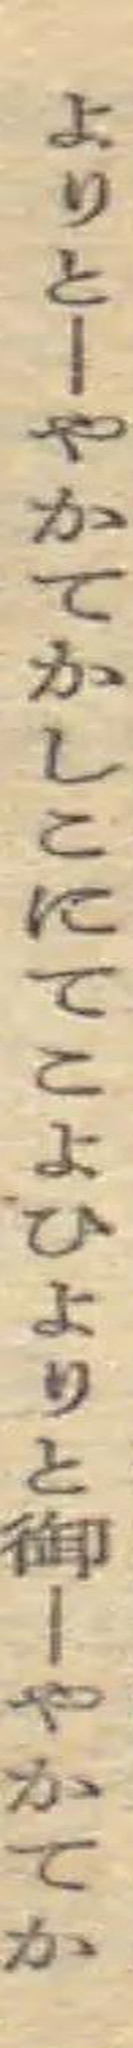よりと―やかてかしこにてこよひよりと御―やかてか
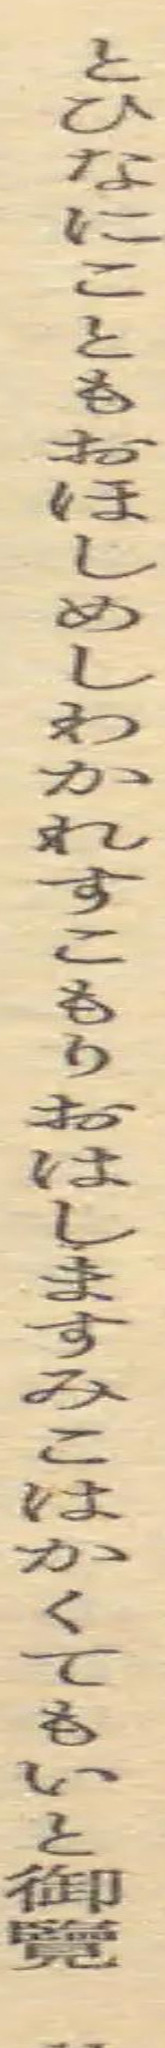とひなにこともおほしめしわかれすこもりおはしますみこはかくてもいと御覧
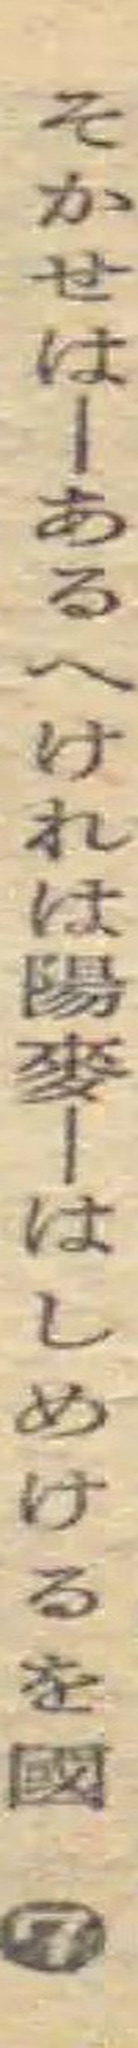そかせは―あるへけれは陽麦―はしめけるを国❼
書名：校異源氏物語.
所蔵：国立国会図書館 National Diet Library, JAPAN
